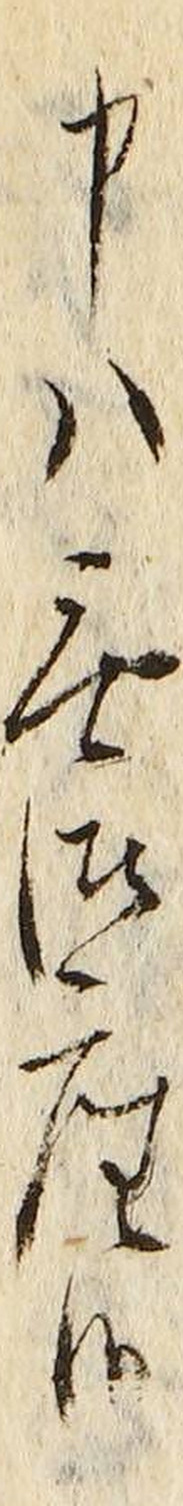申は無御座候
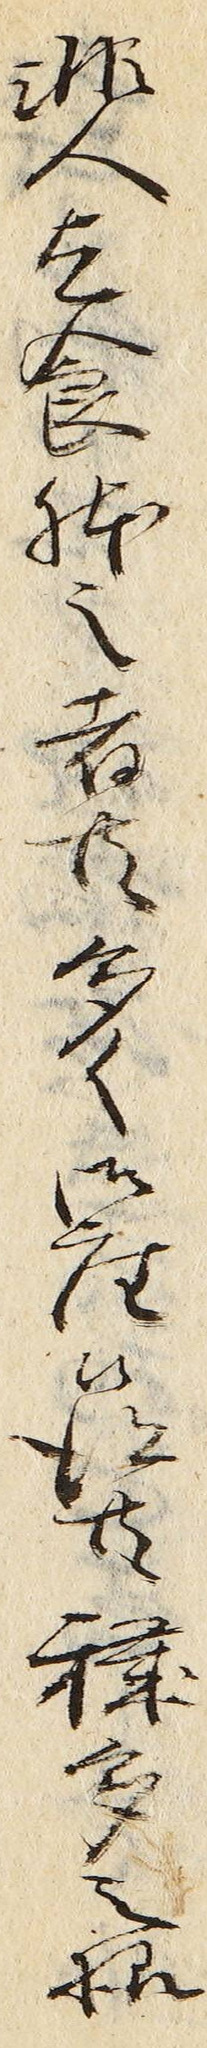非人乞食体之者共多く御座候得共穢多之様
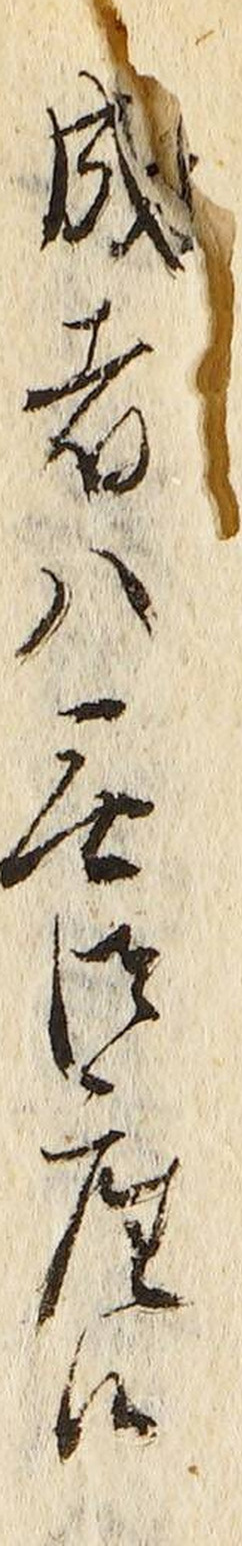成者は無御座候
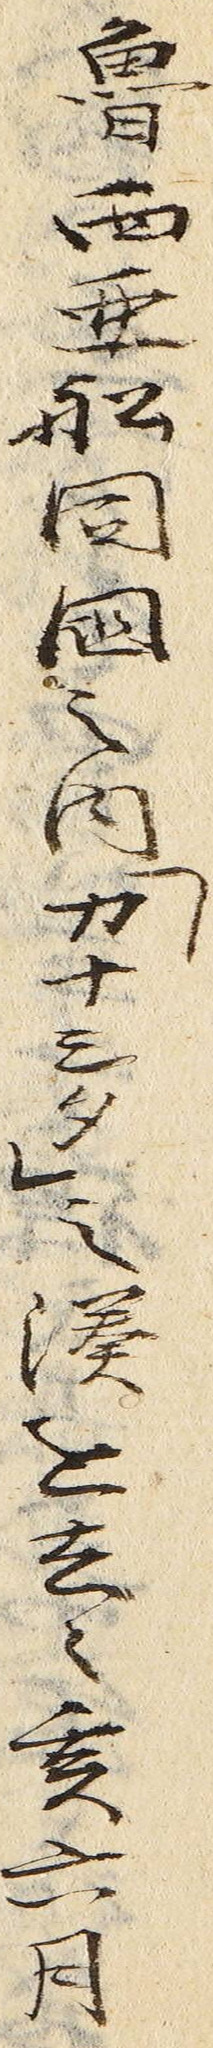魯西亜船同国之内「カナシタ」之湊を去々亥六月
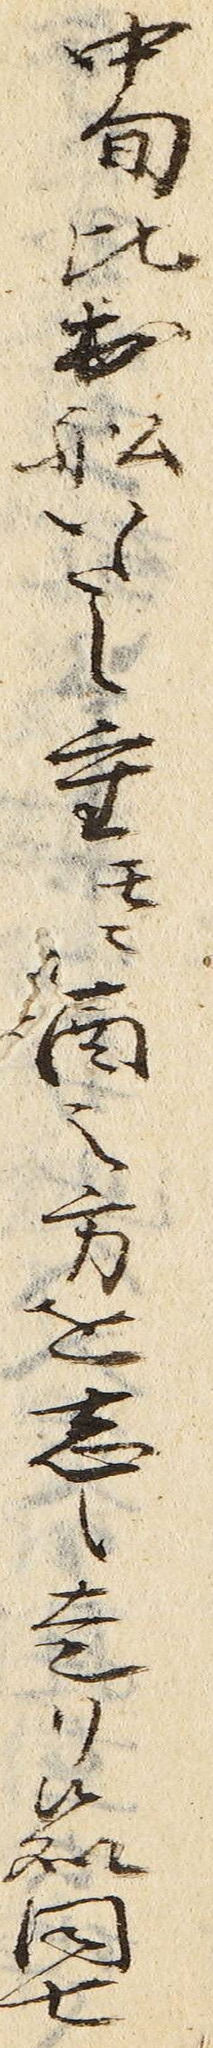中旬比出船いたし重モに酉之方を志し走り候処同七
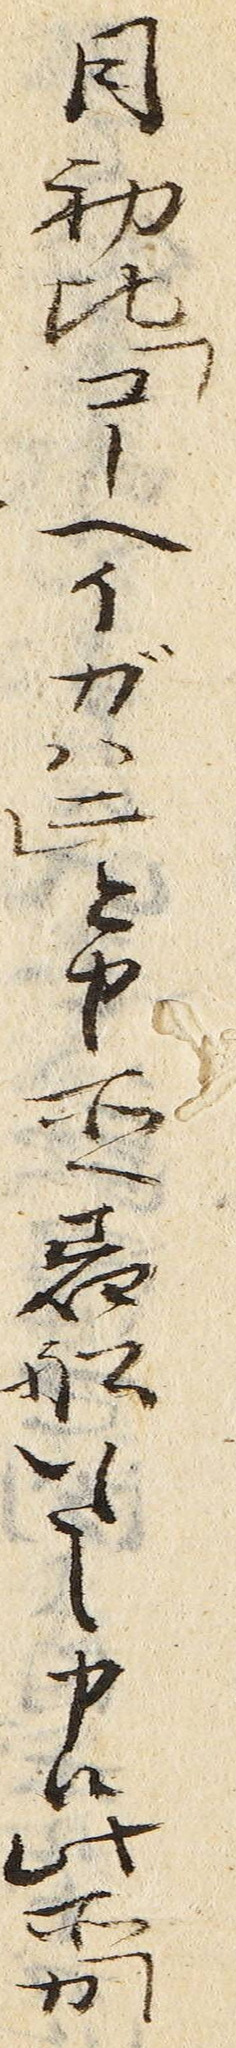月初比「コーヘイガハニ」と申所へ着船いたし申候此所「カ
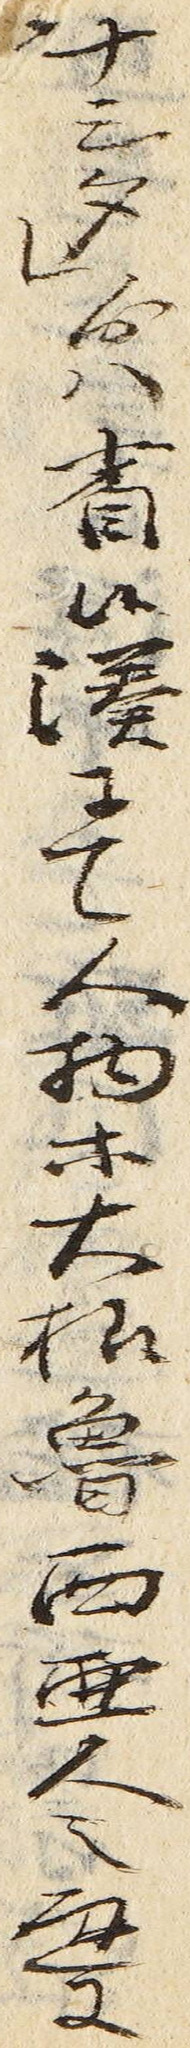ナシタ」ゟは省候湊にて人物等大様魯西亜人之通に
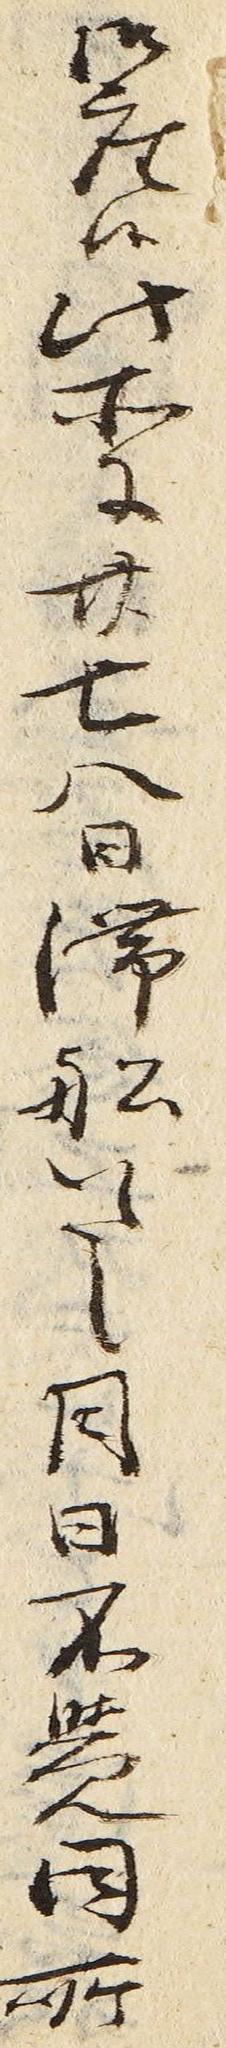御座候此所に廿七八日滞船いたし月日不覚同所
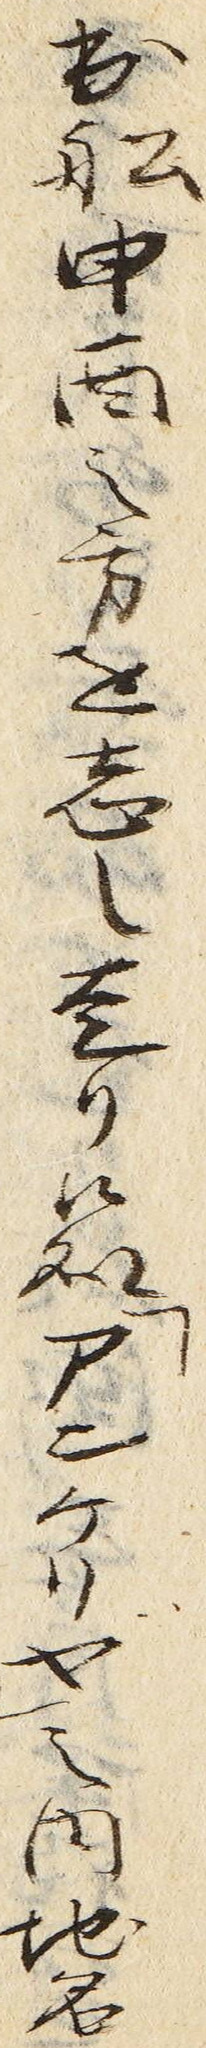出船申酉之方を志し走り候処「アンケリヤ」之内地名
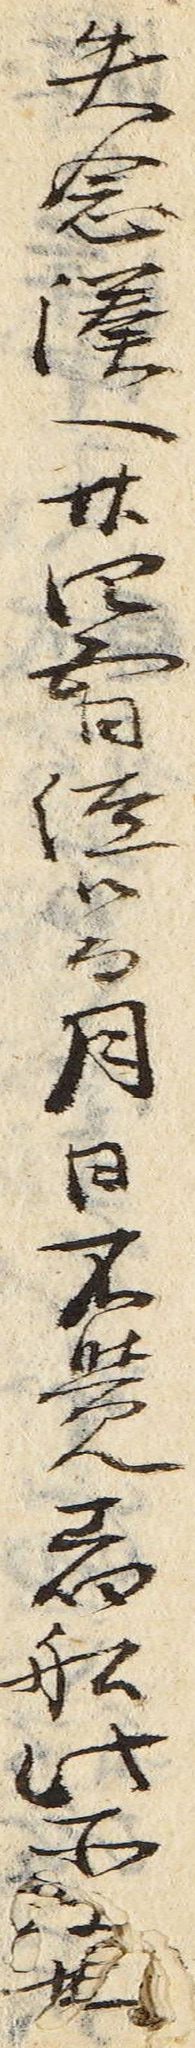失念湊へ廿四五日経候て月日不覚着船此所に廿
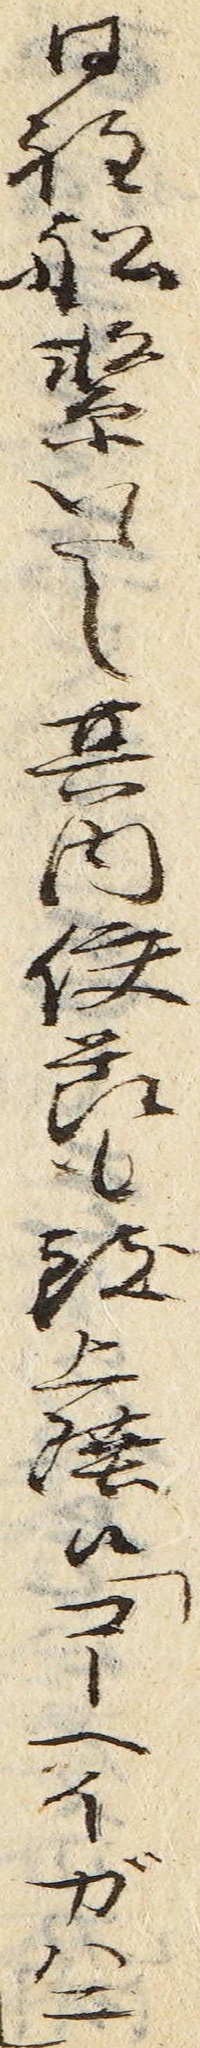日程船繋いたし其内使節も致上陸候「コーヘイガハニ」
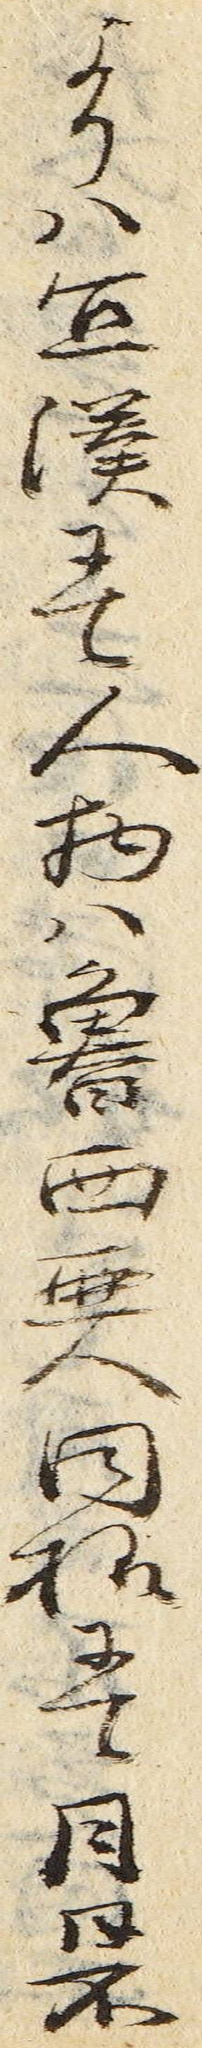よりは宜湊にて人物は魯西亜人同様にて月日不
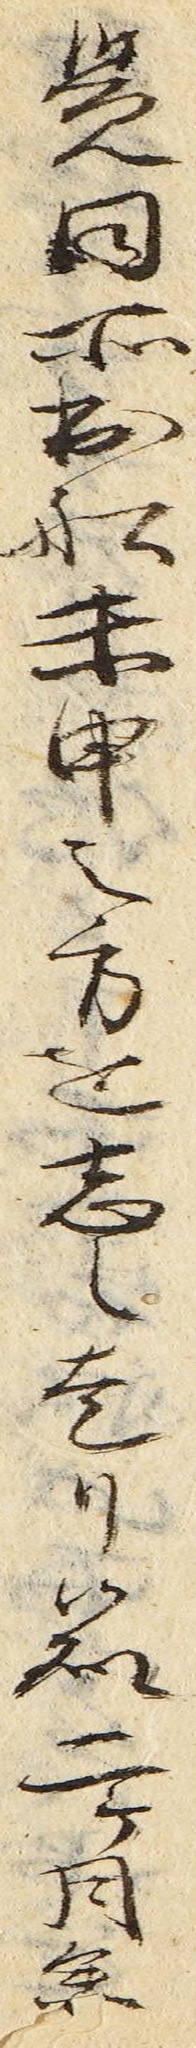覚同所出船未申之方を志し走り候処二ヶ月余

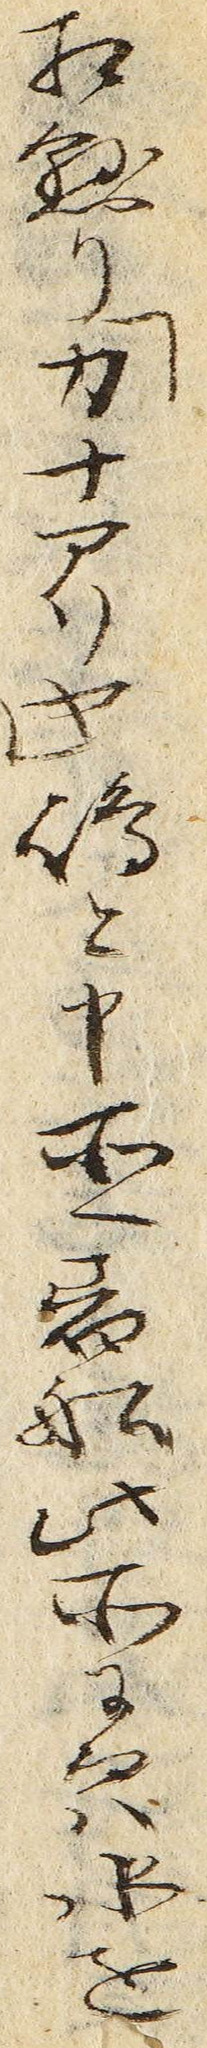相懸り「カナアリヤ」島と申所へ着船此所にては水を
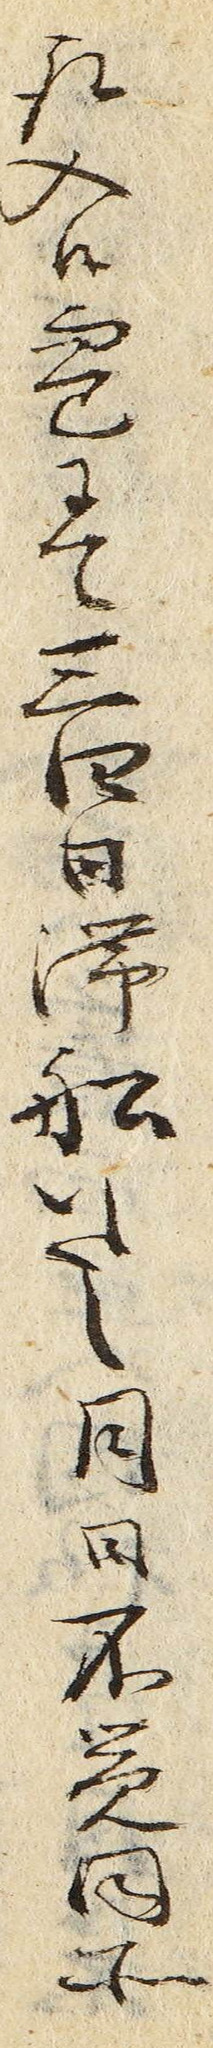取入候而已にて三四日滞船いたし月日不覚同所
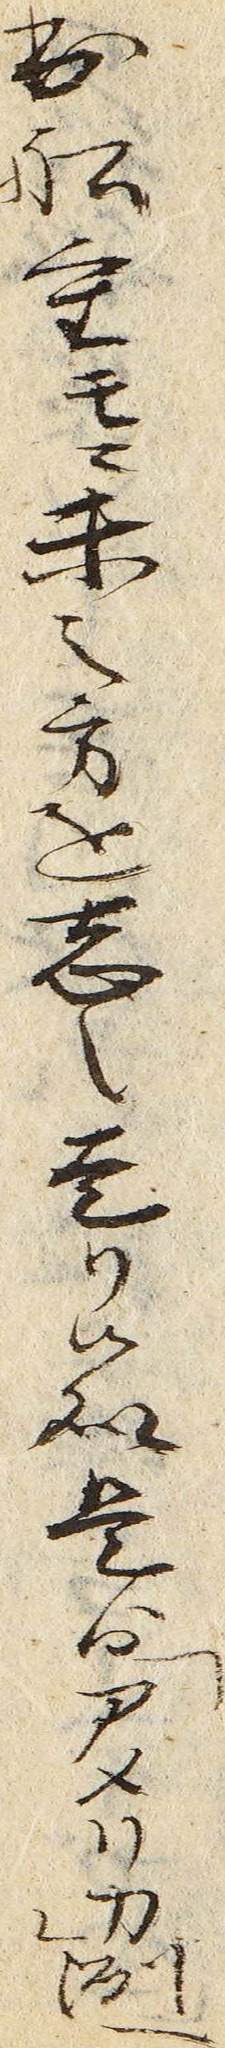出船重モに未之方を志し走り候処是ゟ「アメリカ」洲へ
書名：漂民後記
